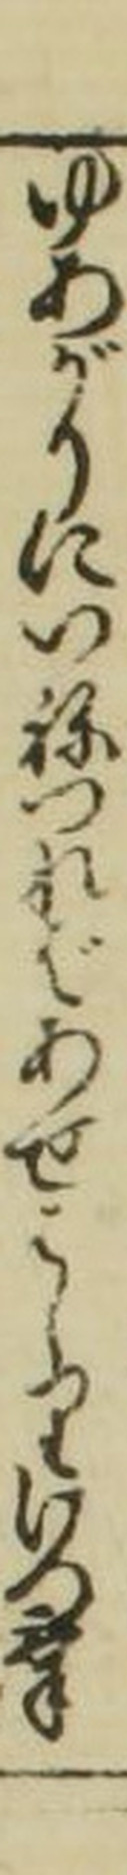ゆあがりにいねつればあせはしりけつ気
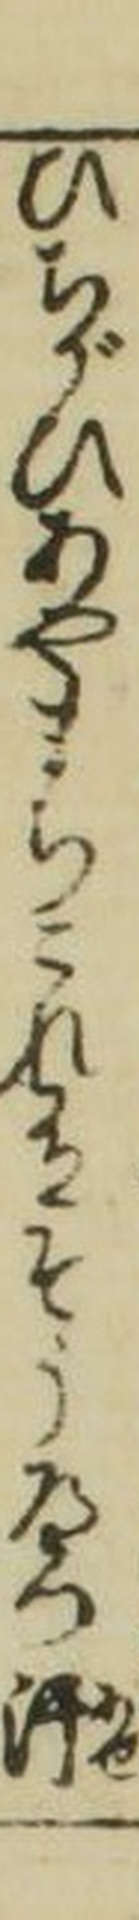ひちがひあやまちこれ有そうへつ汗
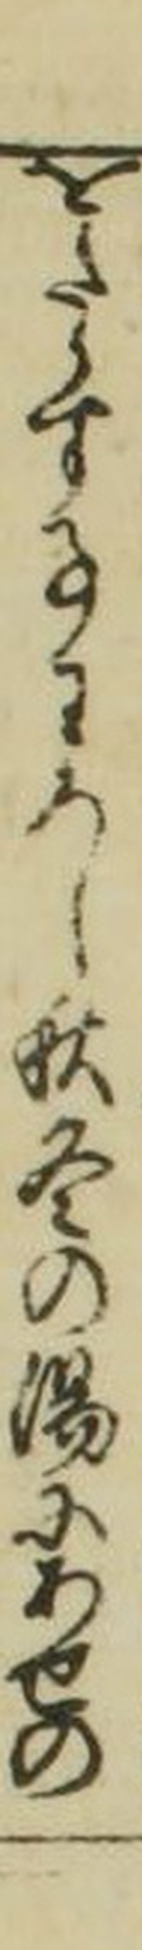をたらす事わろし秋冬の湯にあせの
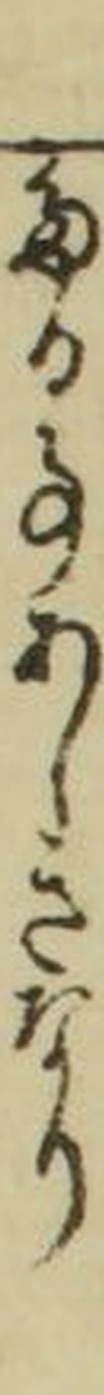たる事あしきなり
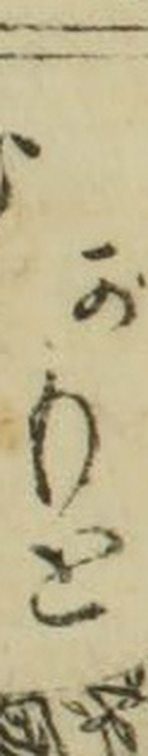がもと
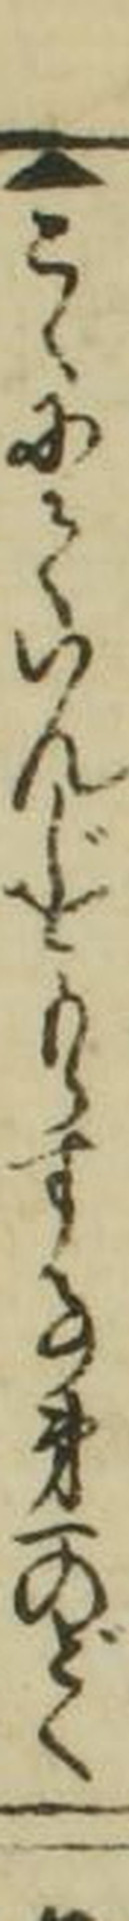▲こゝにていんじをもらす事第一のどく
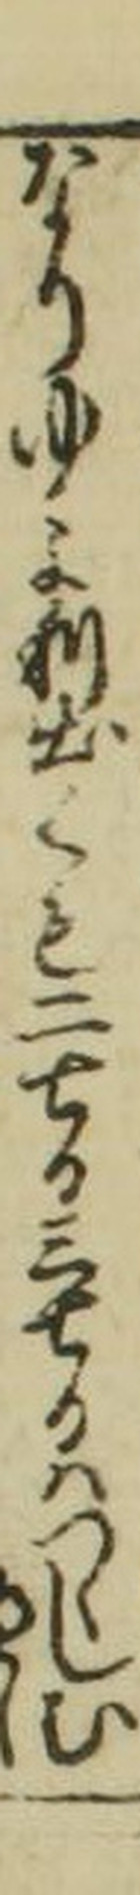なりゆより出ゝも二七日三七日はつゝしむへし
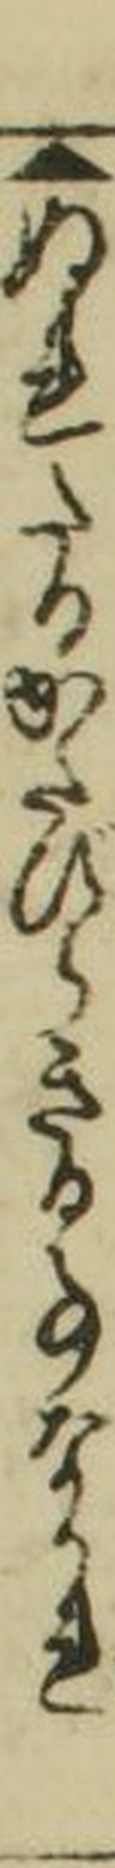▲ぬれたるかたびらきる事なかれ
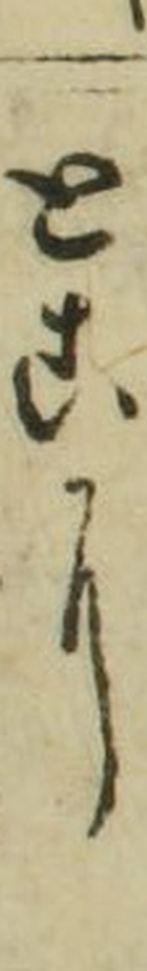とこに
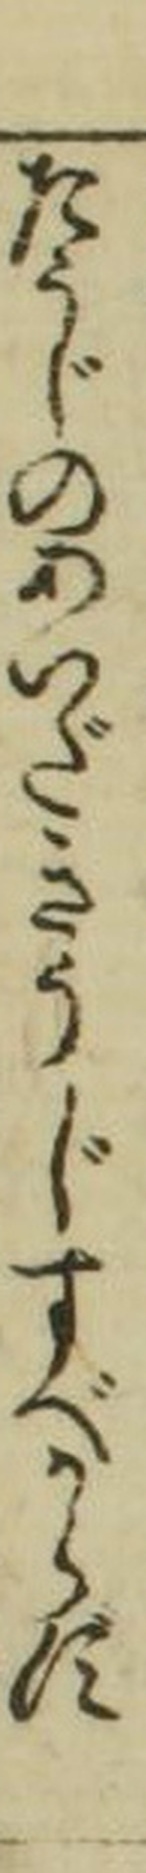たうじのあいだきうじすべからす
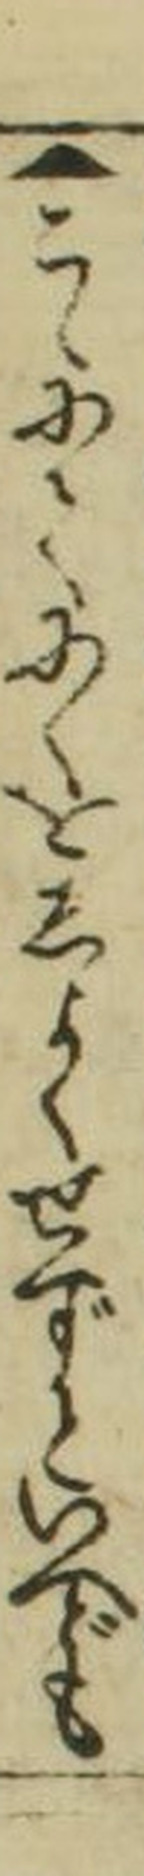▲こゝにてにくをしよくせずといへども
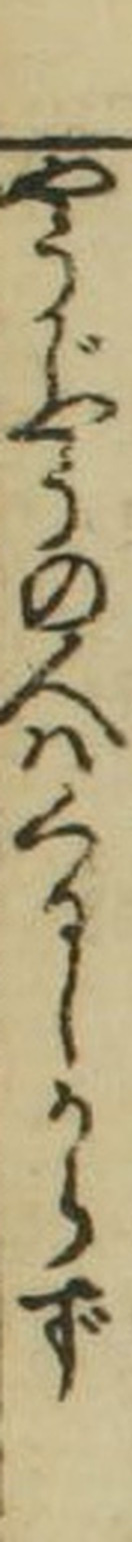やうじやうの人はくるしからず

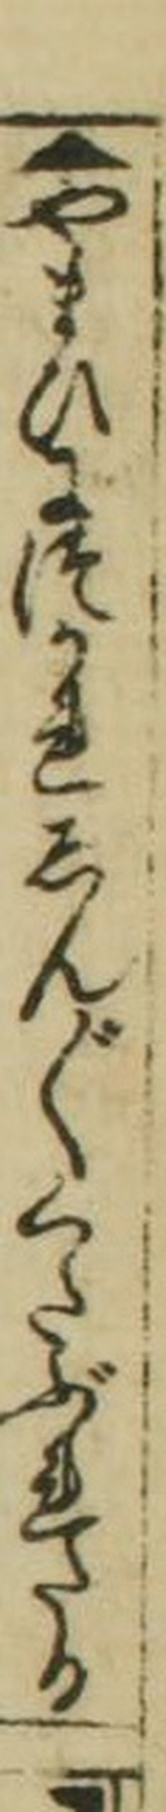▲やまひにつかれしん〴〵くたぶれたる
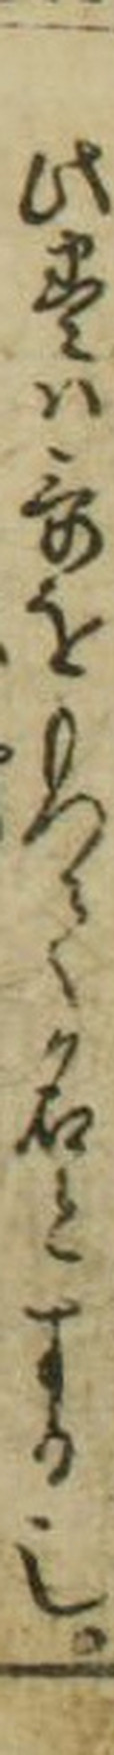此巻は哥をもつて名とする也。
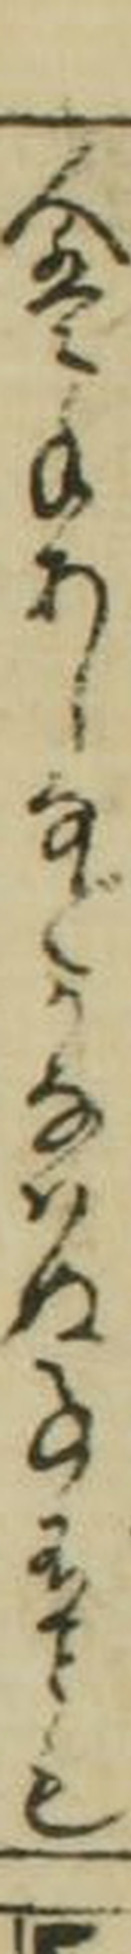人は手あしなどかなはぬ事有とも
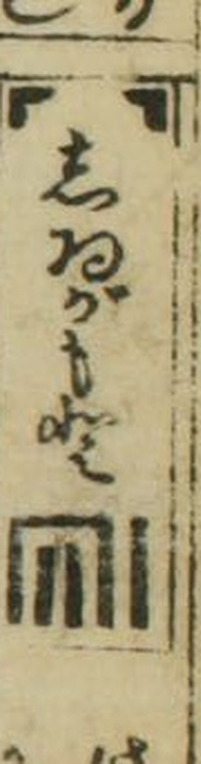しゐがもと
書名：女源氏教訓鑑
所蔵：東京学芸大学附属図書館
